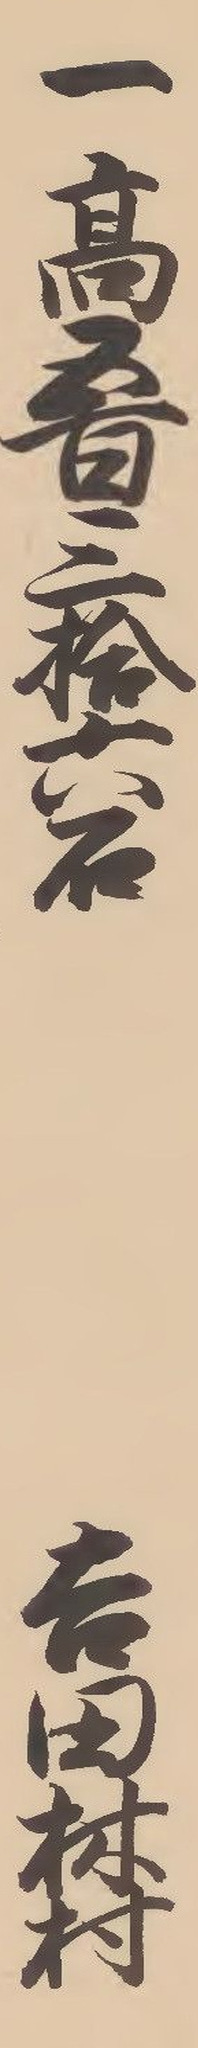一高五百三拾六石吉田林村
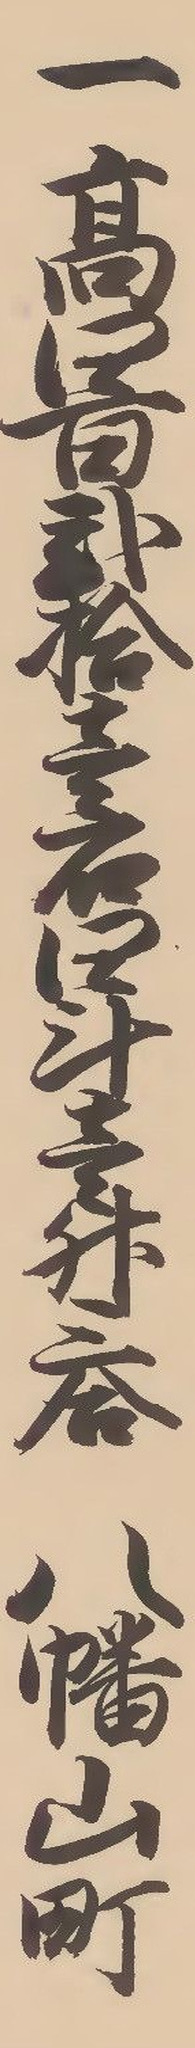一高四百弐拾壱石四斗壱升三合八幡山町
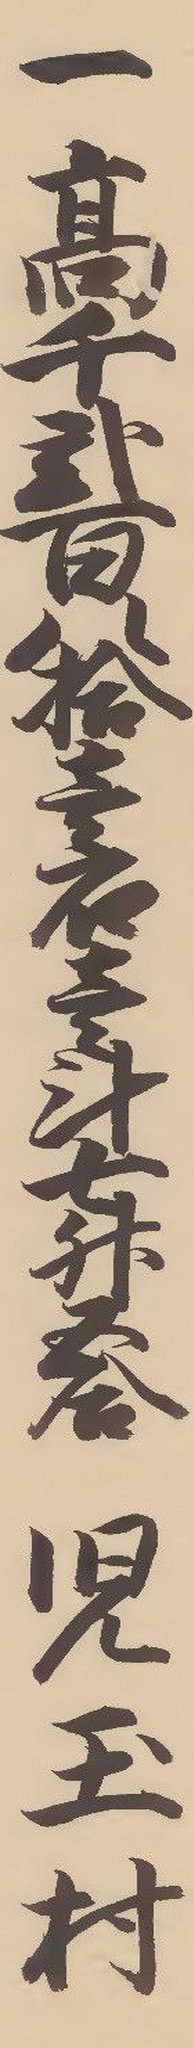一高千弐百八拾壱石壱斗七升五合児玉村
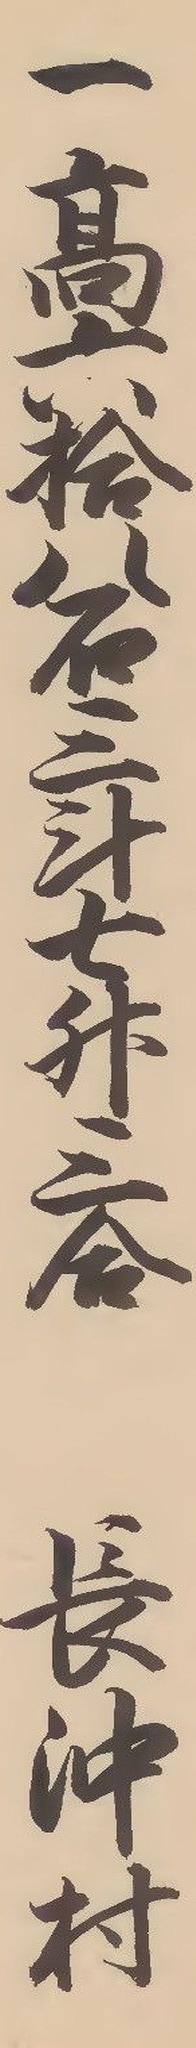一高六拾八石三斗七升三合長沖村
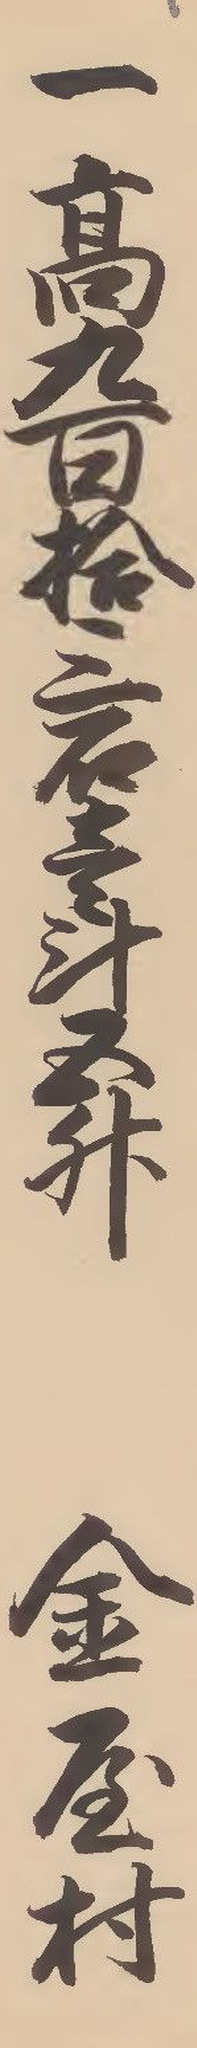一高九百拾三石壱斗五升金屋村
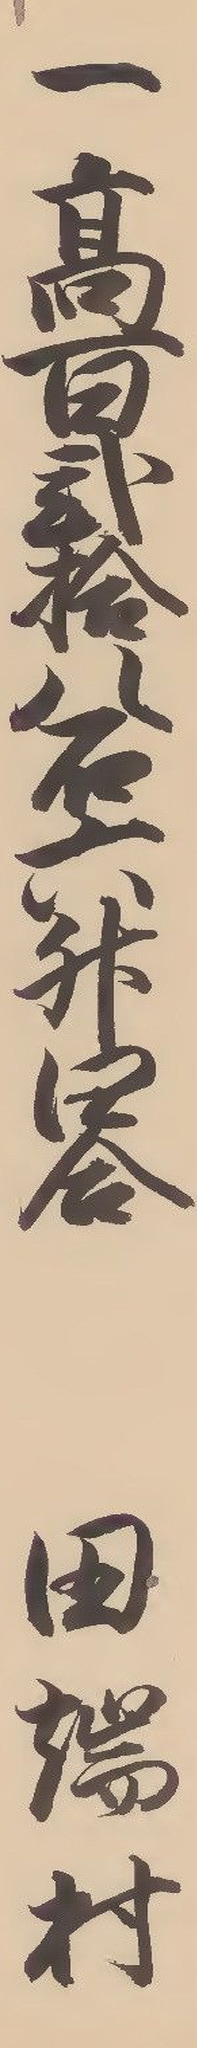一高百弐拾八石六升四合田端村

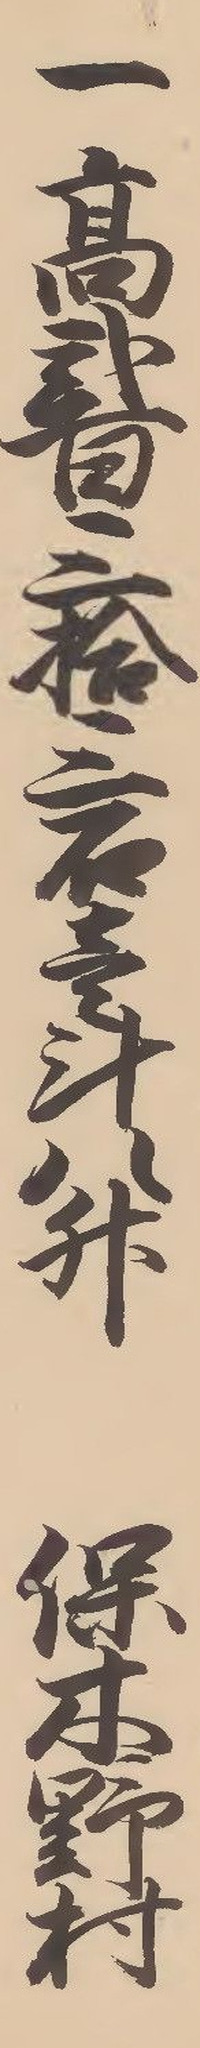一高弐百三拾三石壱斗八升保木野村
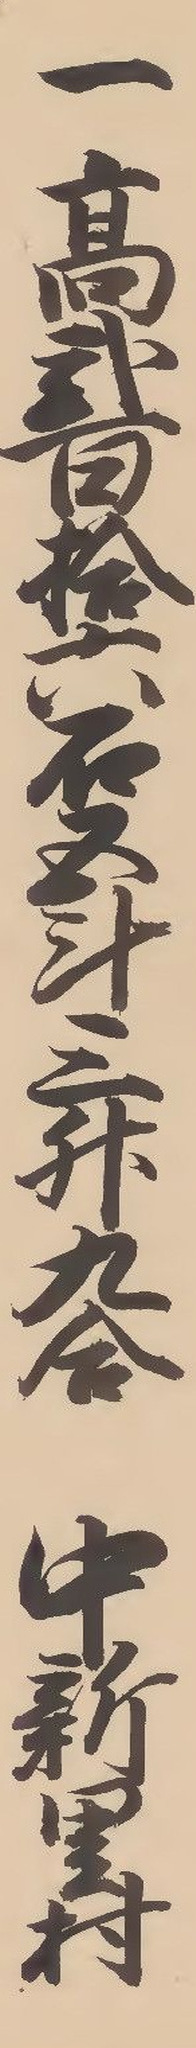一高弐百拾六石五斗三升九合中新里村
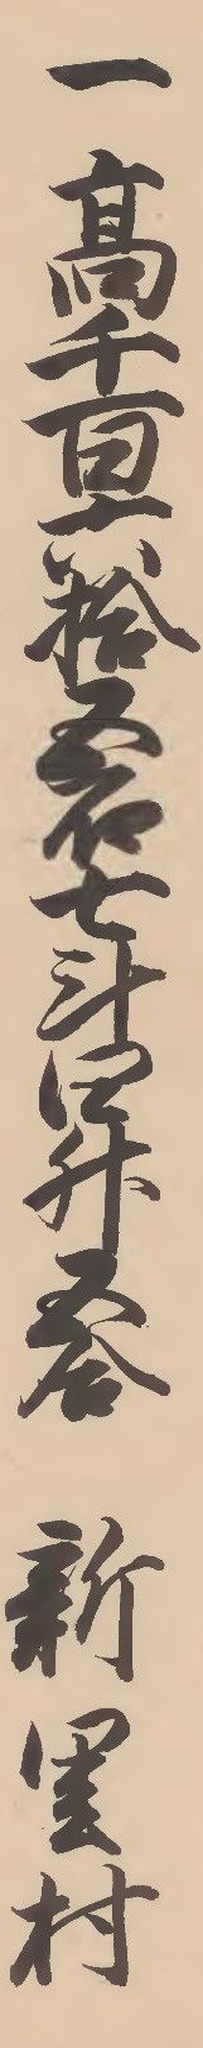一高千百六拾五石七斗四升五合新里村
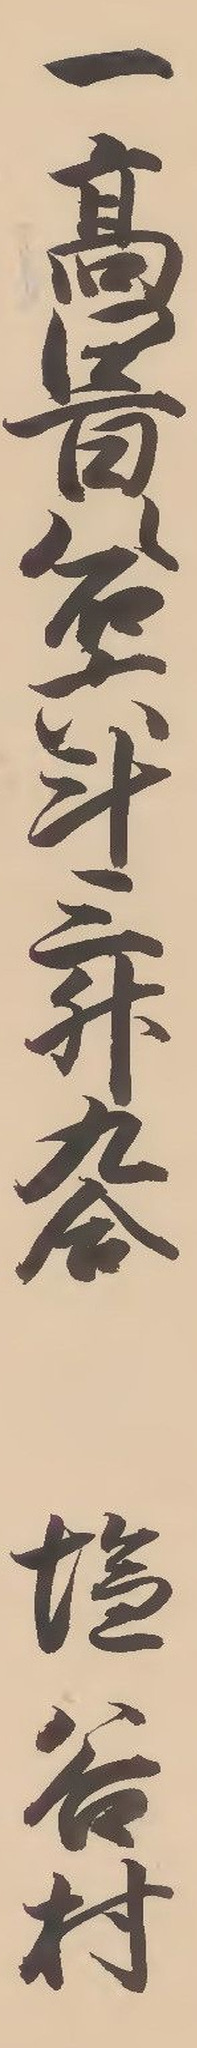一高四百八石六斗三升九合塩谷村
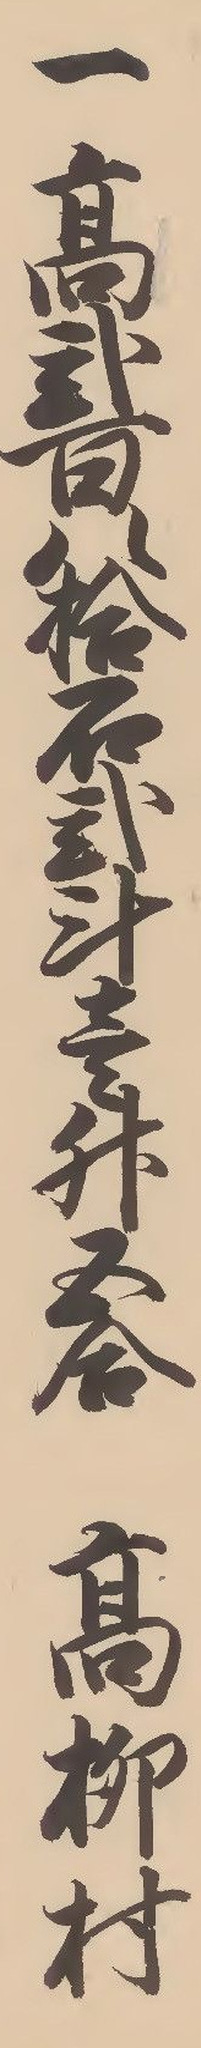一高弐百八拾石弐斗壱升五合高柳村
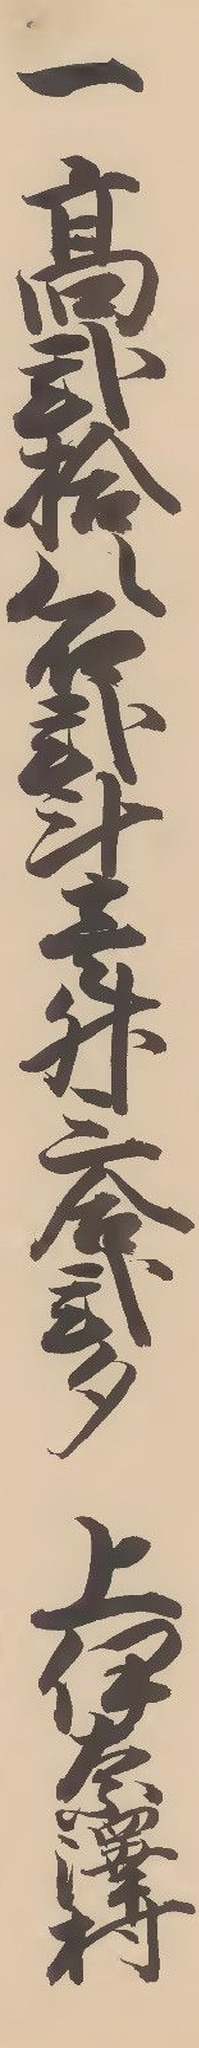一高弐拾八石弐斗壱升三合弐勺上伊奈澤村

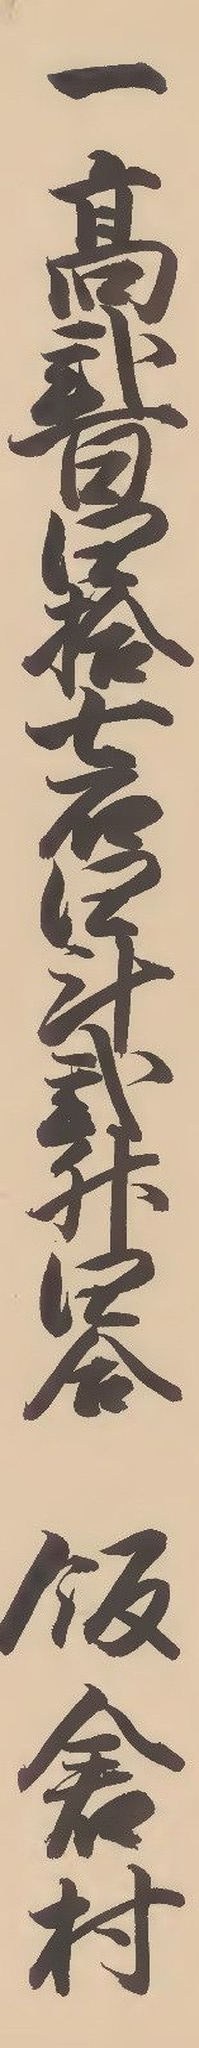一高弐百四拾七石四斗弐升四合飯倉村
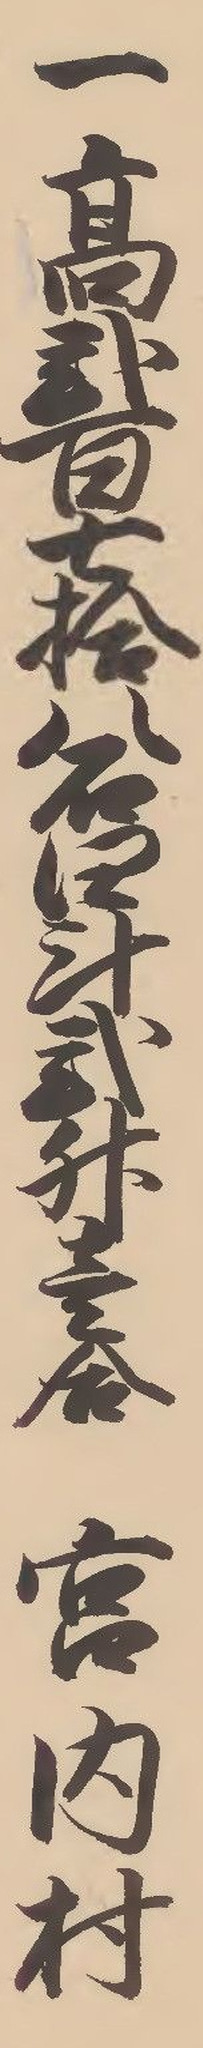一高弐百七拾八石四斗弐升壱合宮内村
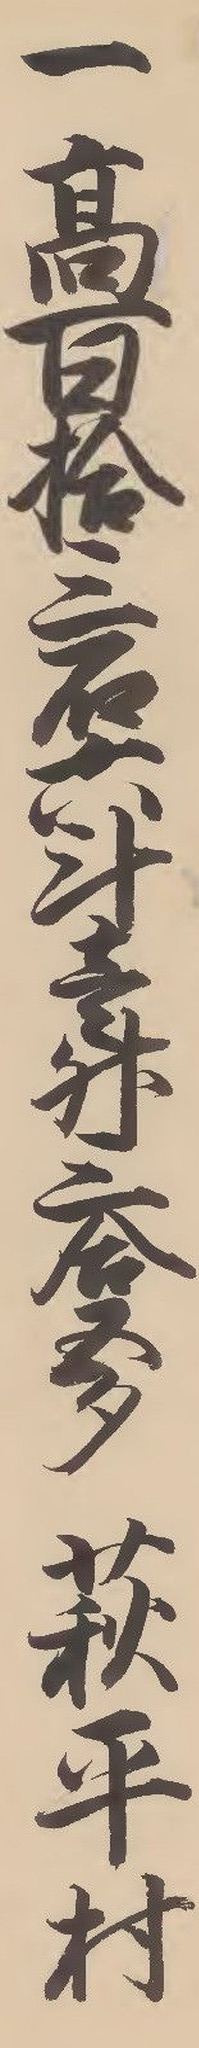一高百拾三石六斗壱升三合五勺萩平村
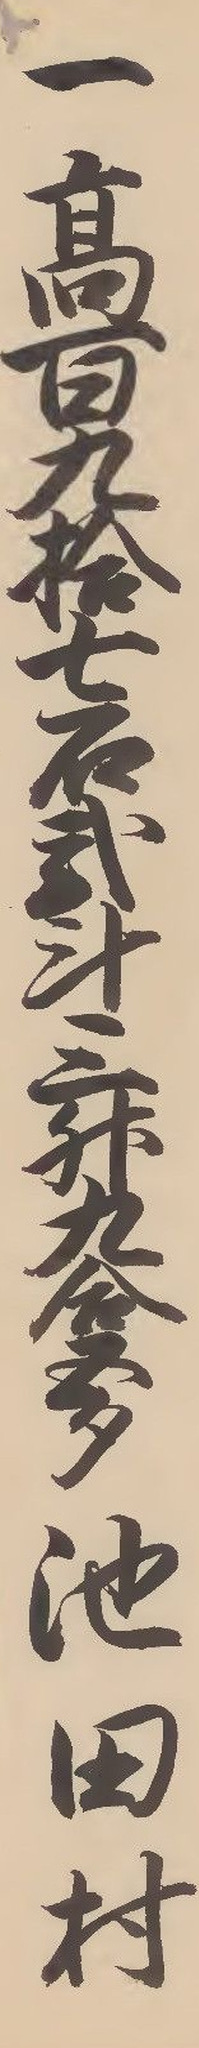一高百九拾七石弐斗三升九合五勺池田村
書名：武蔵国郷帳　下
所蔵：国立公文書館 National Archives of Japan
